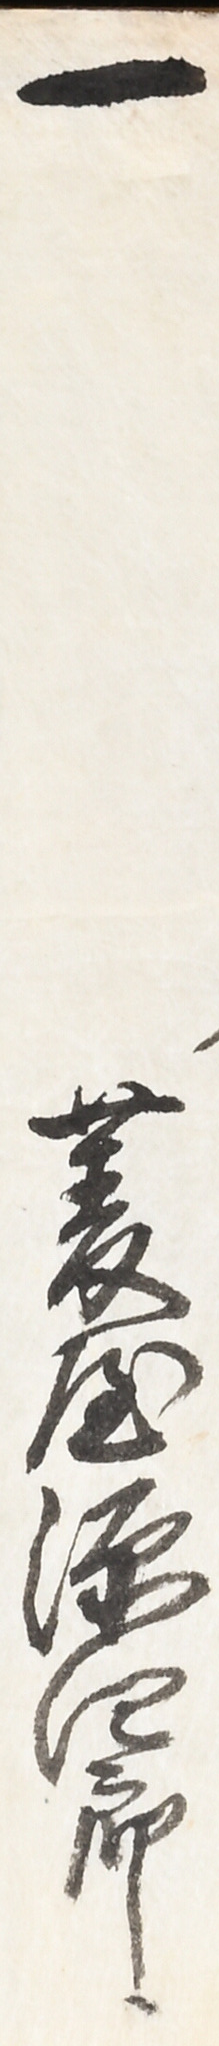一菱屋源四郎・
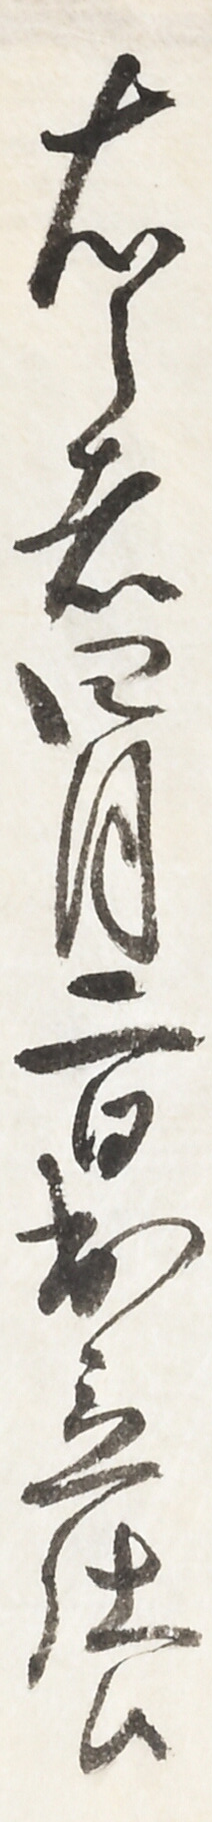右之者四月二日出立仕候
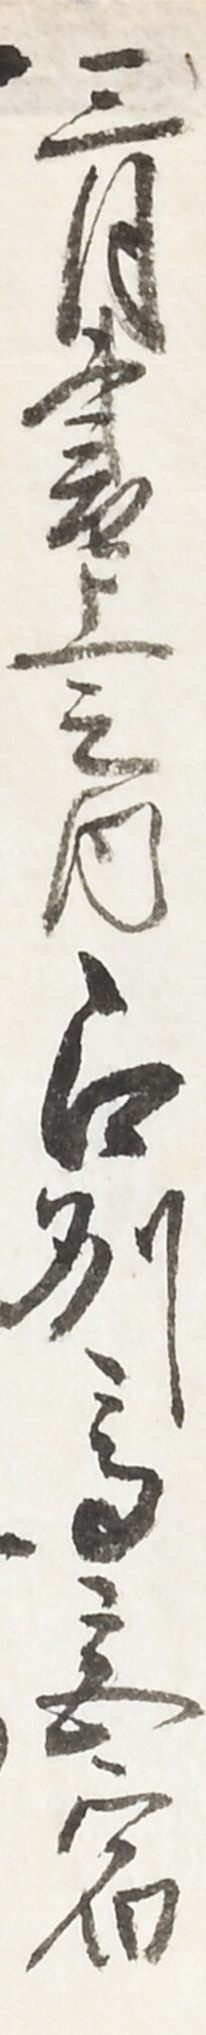三月書上之内江州高宮宿
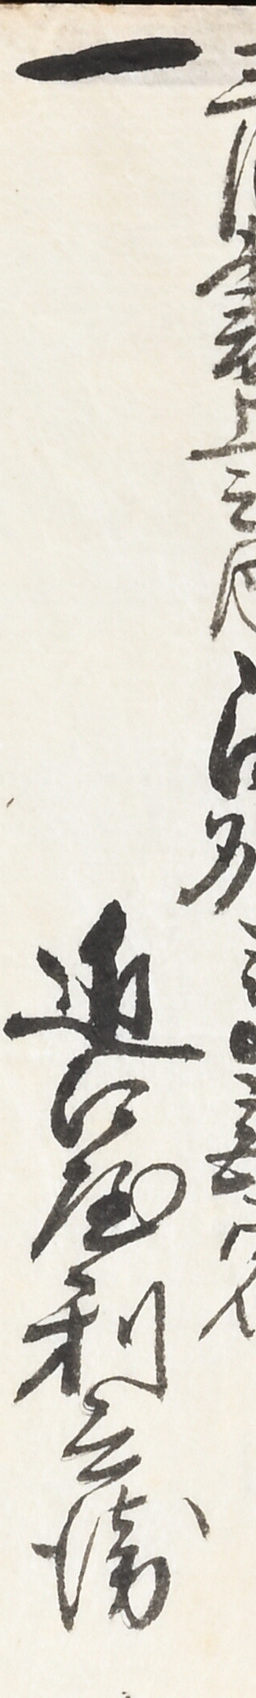一近江屋利兵衛・
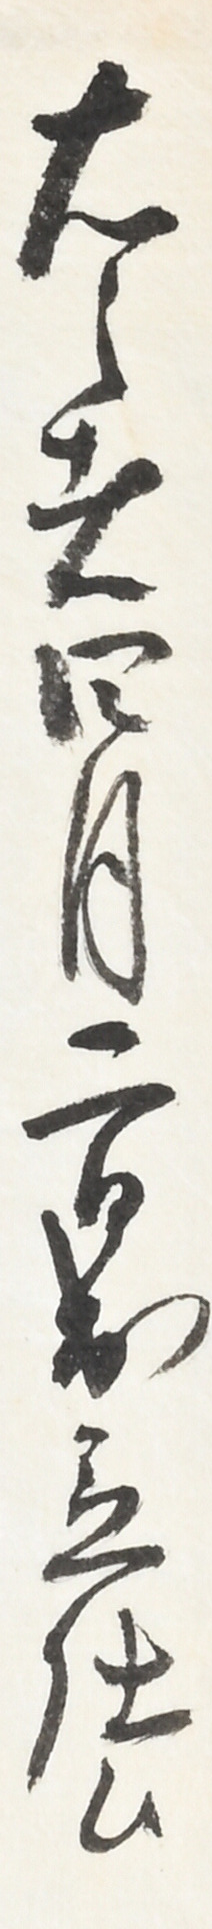右之者四月二日出立仕候
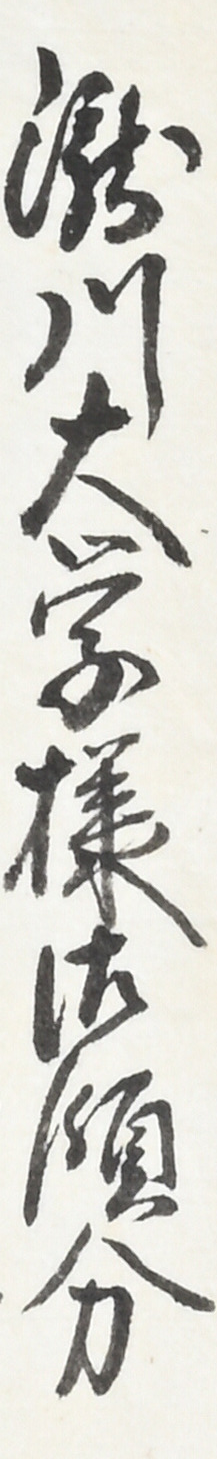瀧川大学様御領分
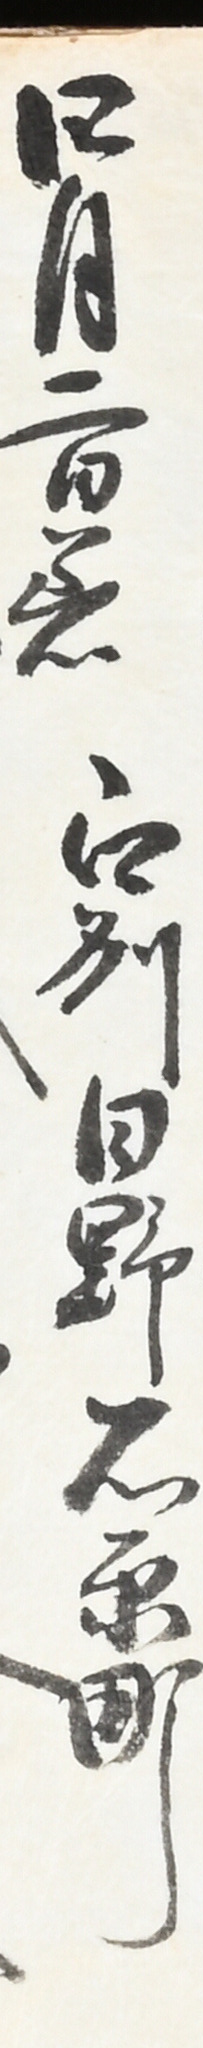四月二日着江州日野石原町
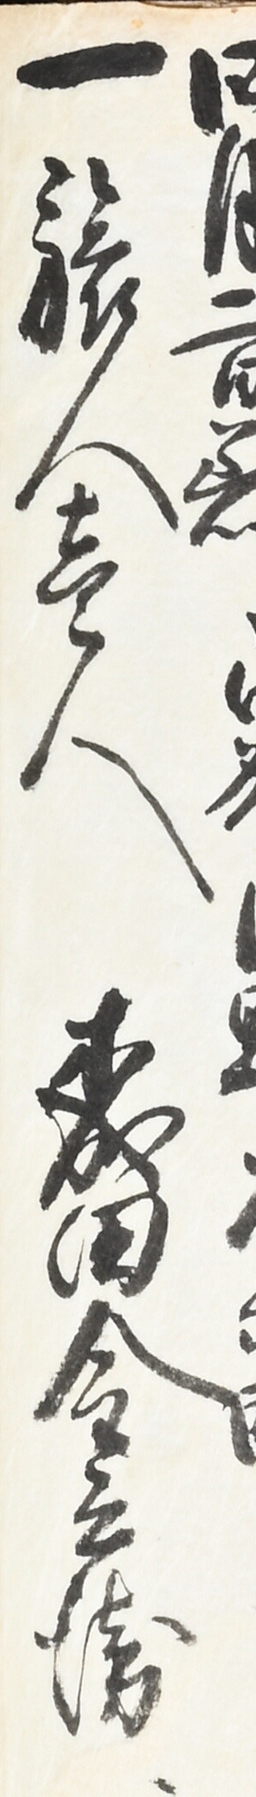一旅人壱人森田金兵衛
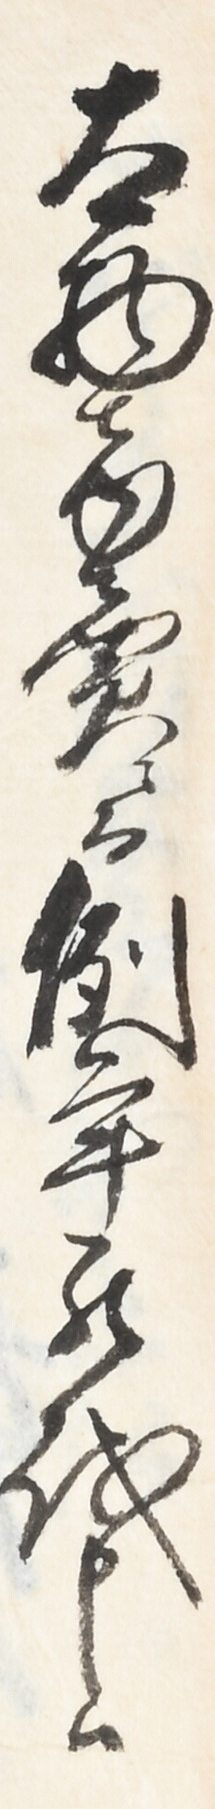夏物商売ニ而例年罷越申候
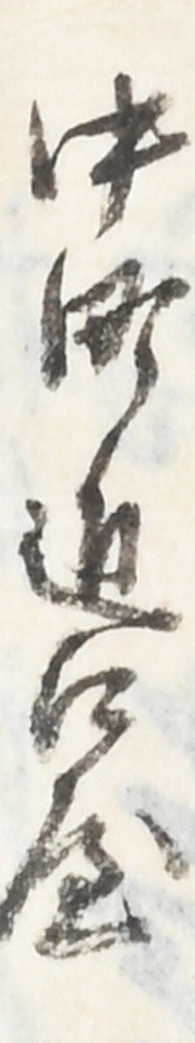中町近江屋
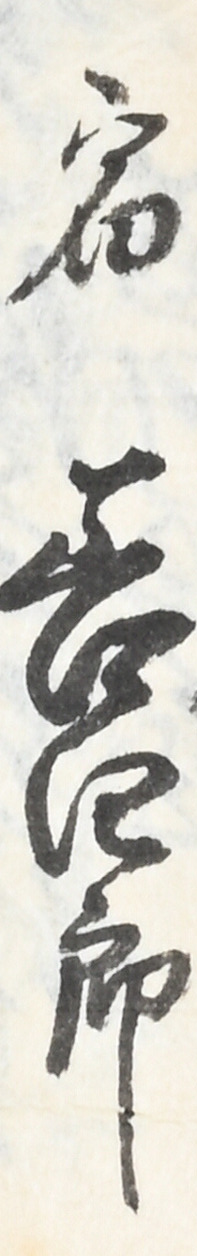宿善四郎
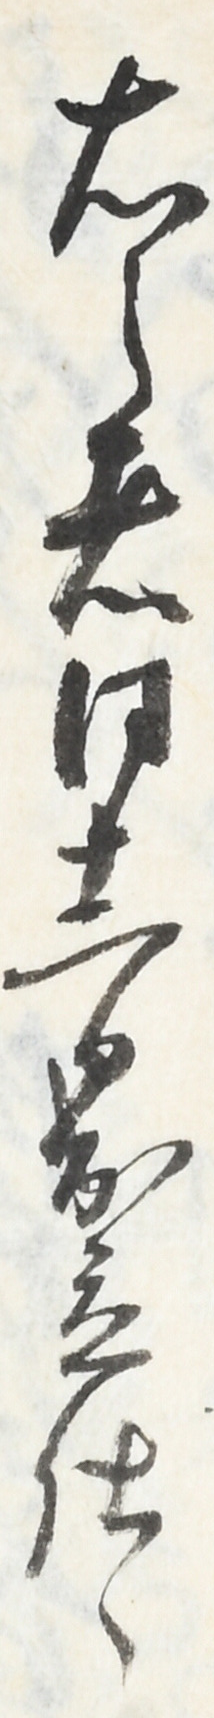右之者同十二日出立仕候

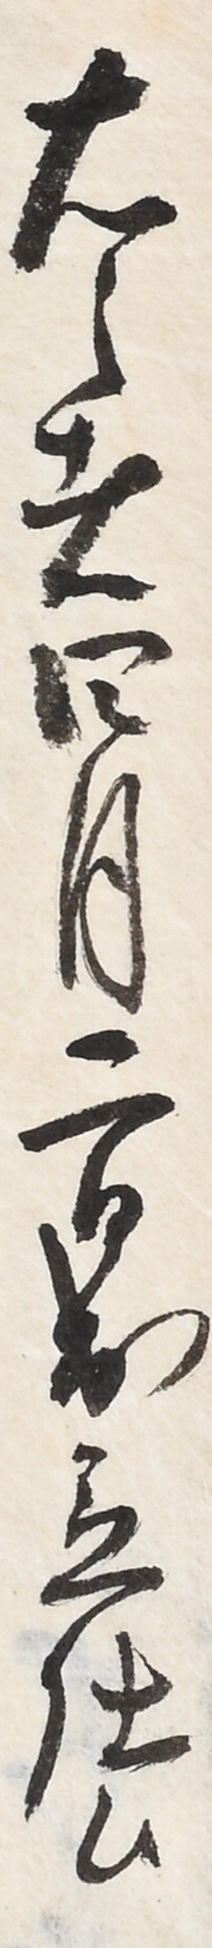右之者四月七日出立仕候
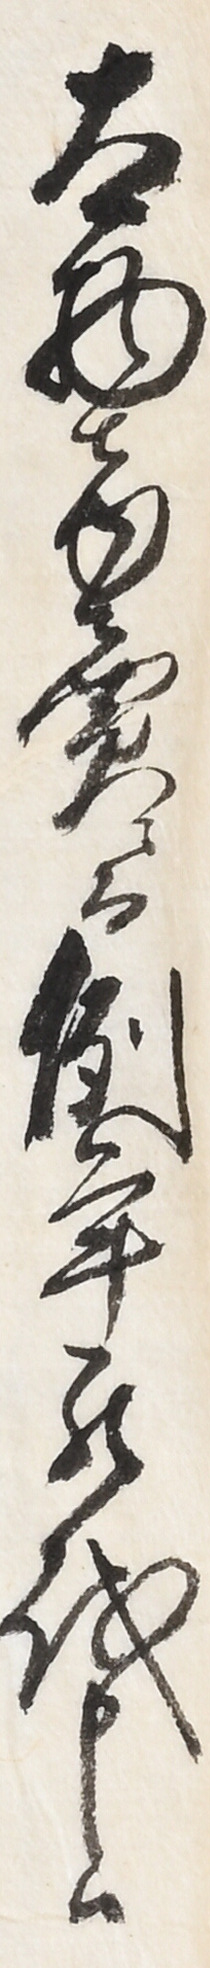太物商売ニ而例年罷越申候
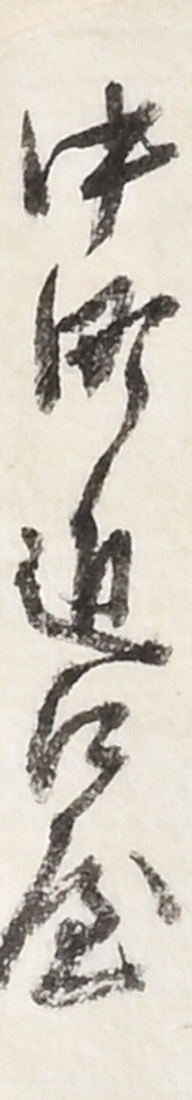中町近江屋
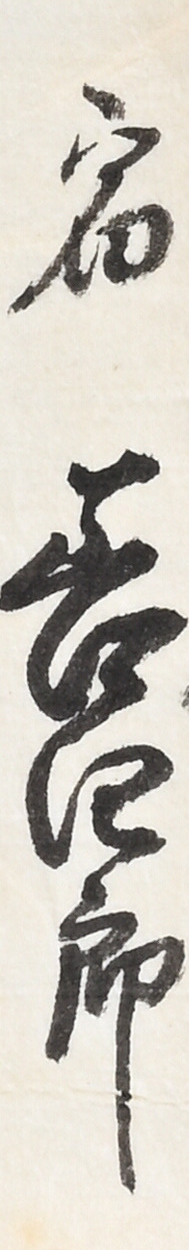宿善四郎
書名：旅人泊控帳
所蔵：伊那市立高遠町図書館・合同会社AMANE
